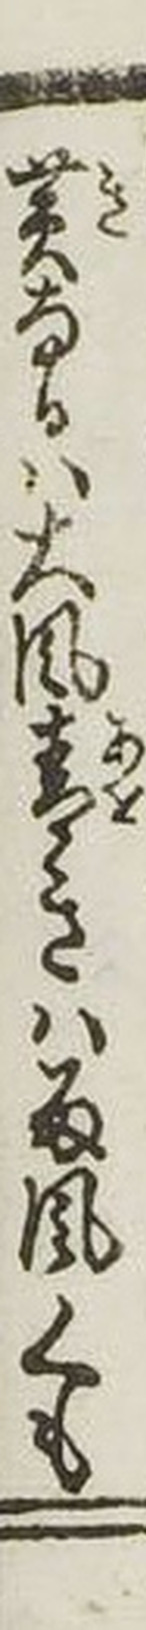黄なるは大風青きは雨風くも
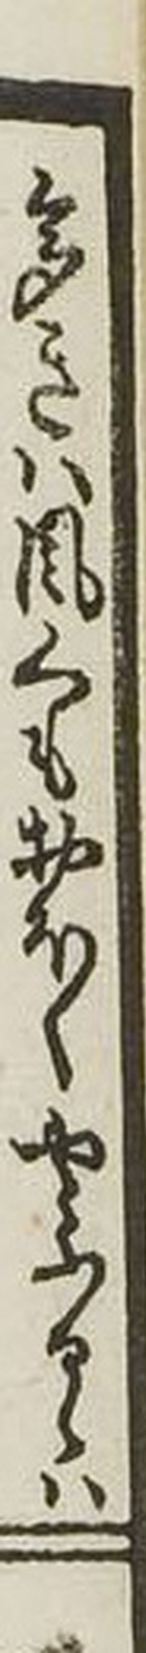多きは風くもおほくやふるゝは
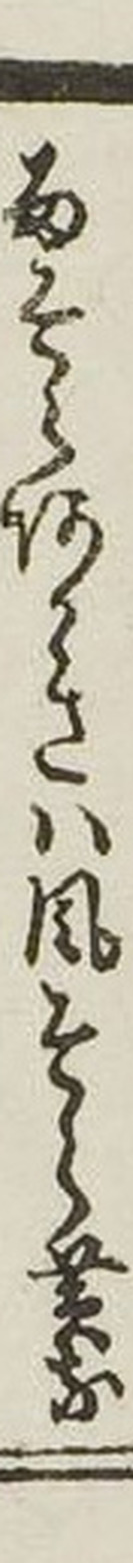雨そらあかきは風そら黄な
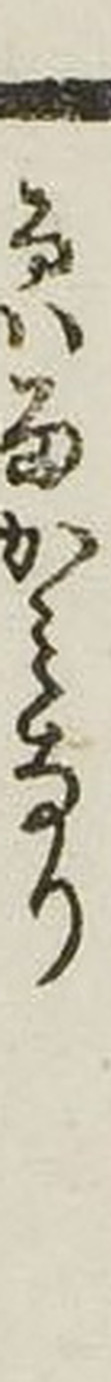るは雨かみなり
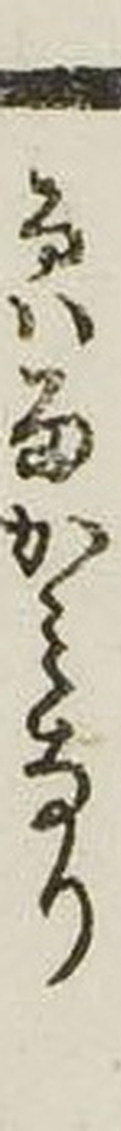るは雨かみなり
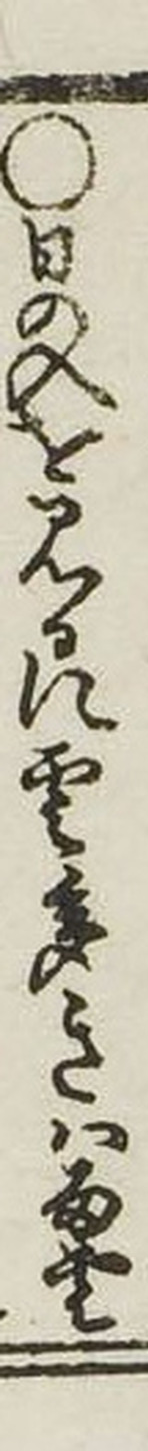○日の入を見るに雲多きは雨雲
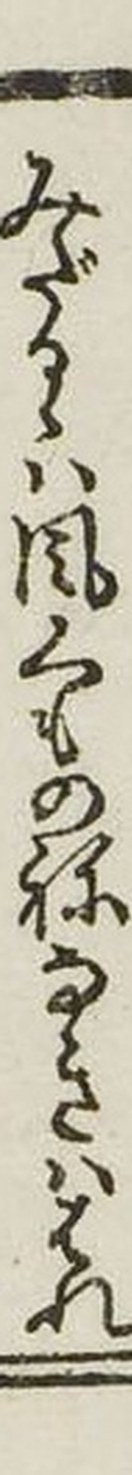みだるゝは風くものねなきははれ
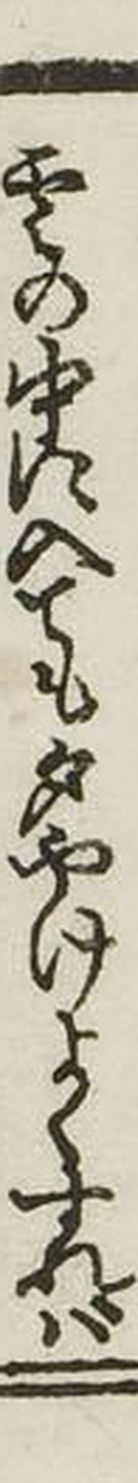雲の中に入りても夕やけよくすれば
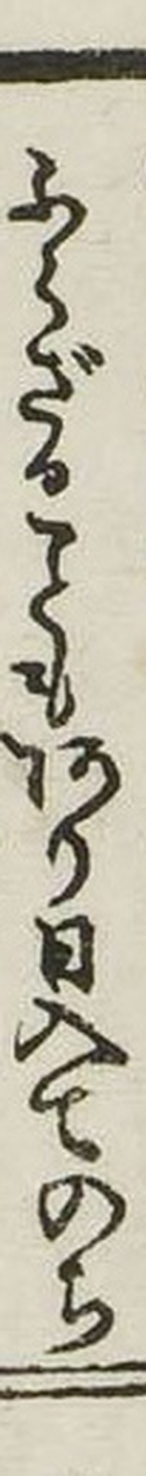ふらざることもあり日入てのち
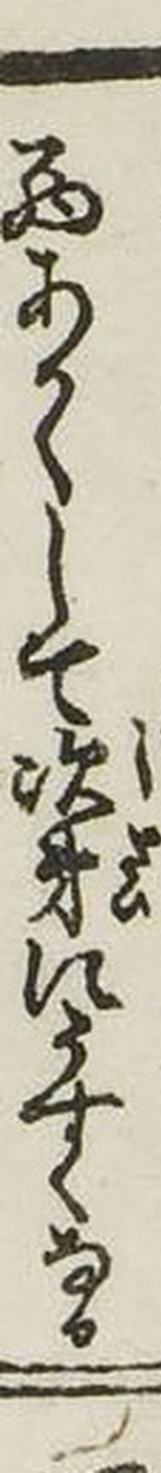西あかくして次第にうすくなる
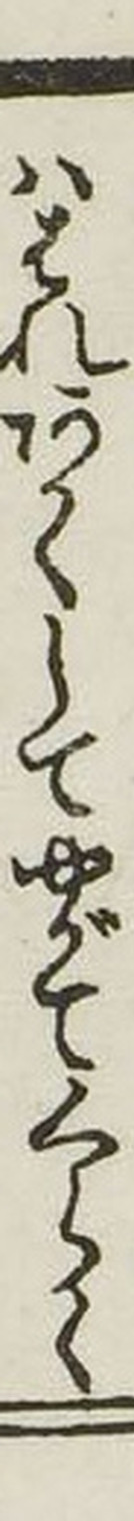ははれあかくしてやがてくらく
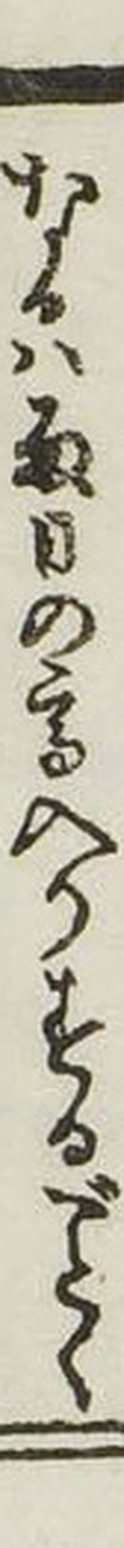なるは雨日の高入りするごとく
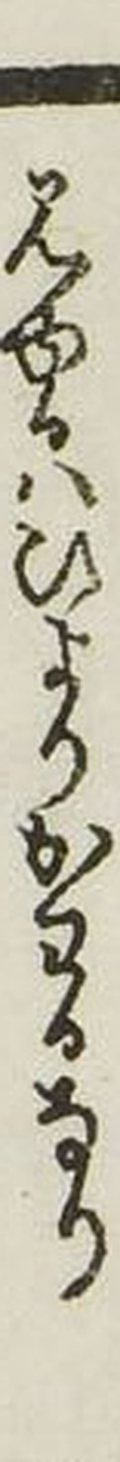見ゆるはひよりかわるなり
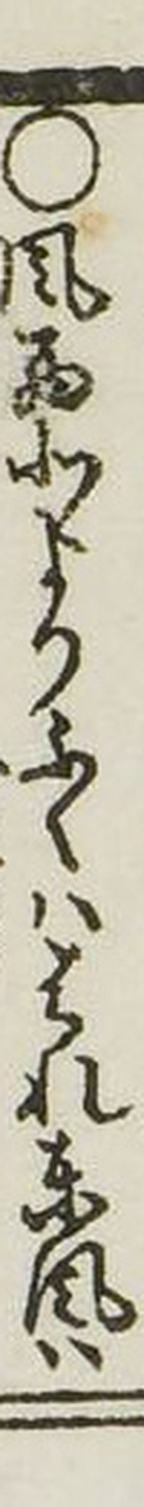○風雨北よりふくははれ東風は
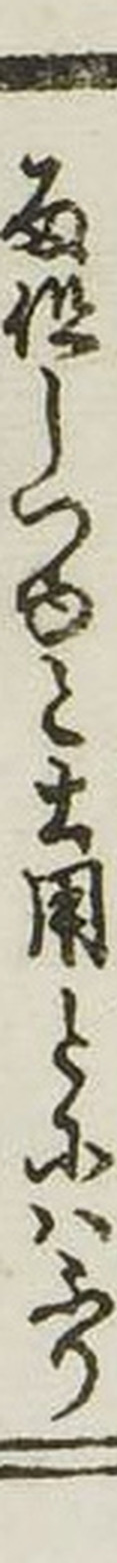雨但しつゆと土用とにはふり
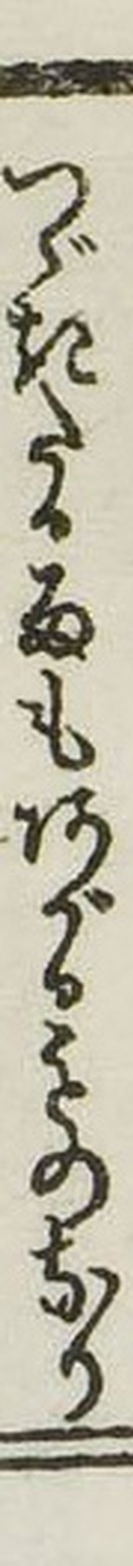つゞきたる雨もあがるものなり
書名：商人書翰便覧
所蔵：東京学芸大学教育コンテンツアーカイブ
